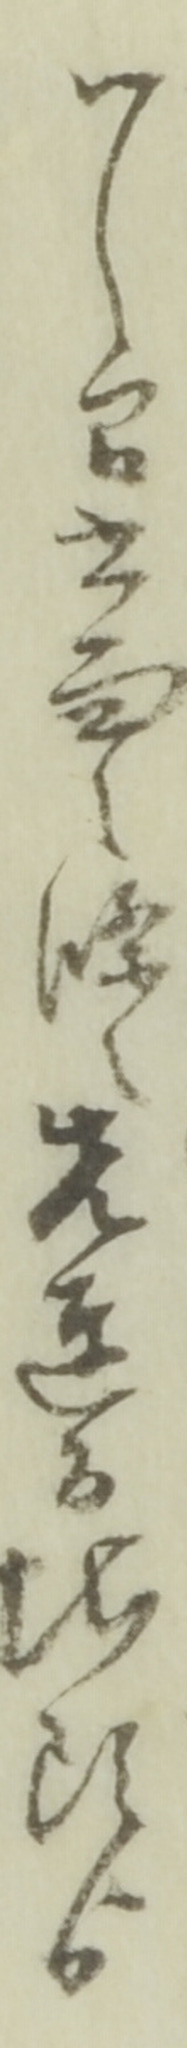候之旨書面之條々先達而地頭より
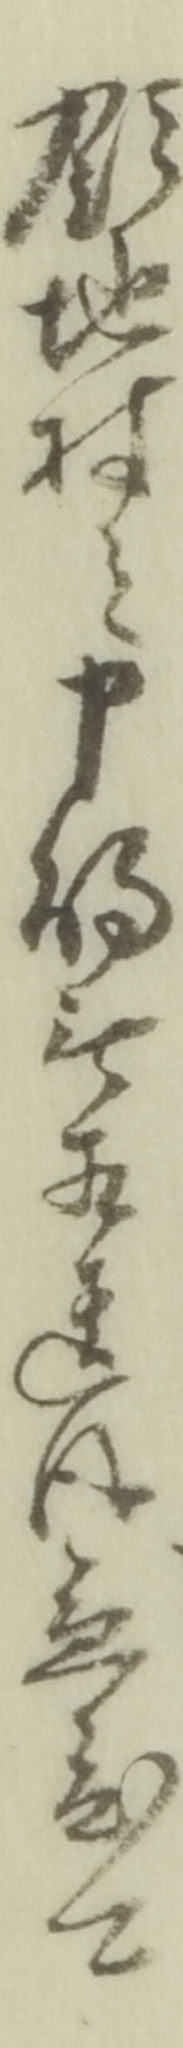領地村々申触無相違候様急度可
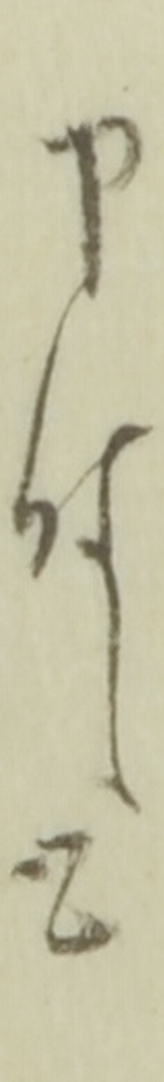申付候以上
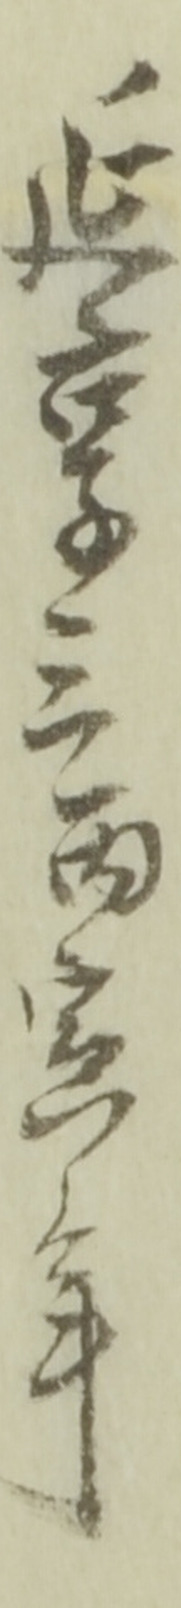延享三丙寅年
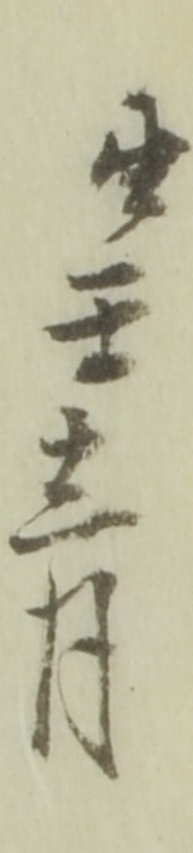丑壬十二月
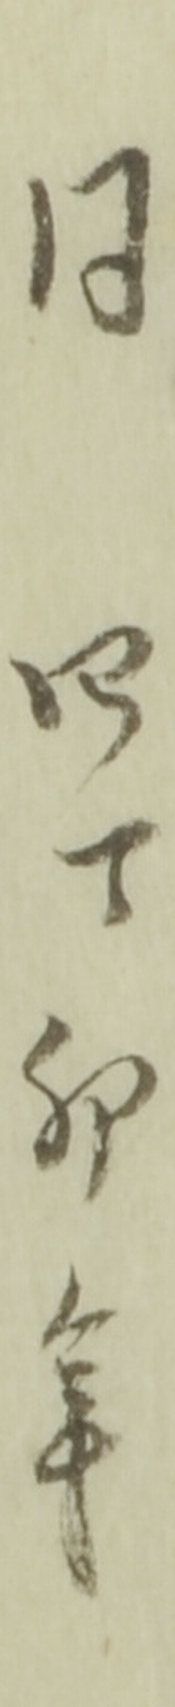同四丁卯年
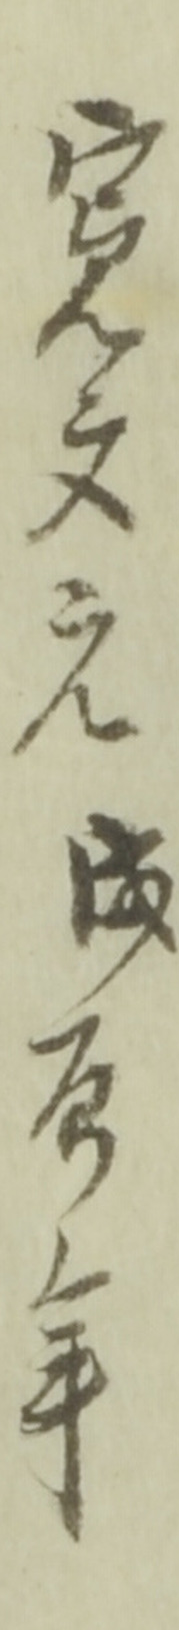寛文元戊辰年
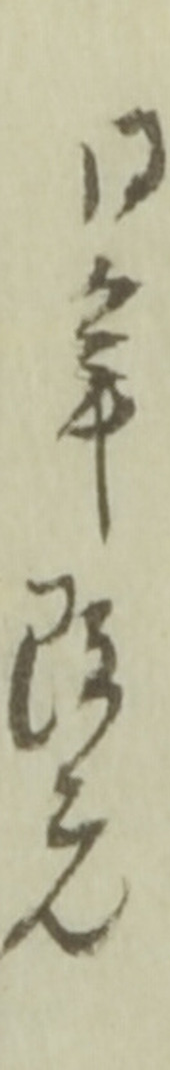同年改元
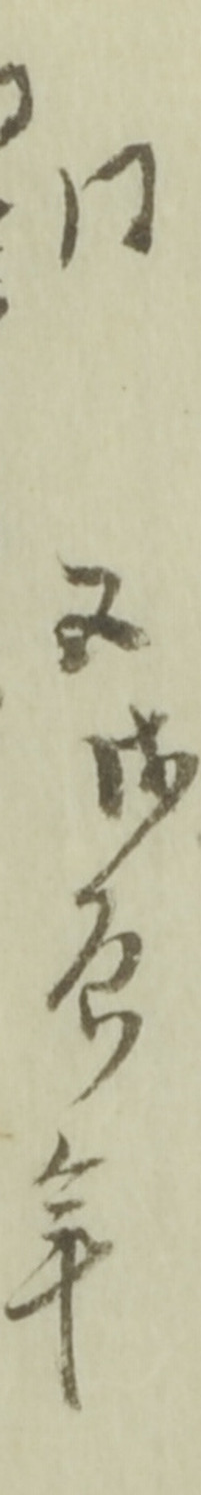同五戊辰年
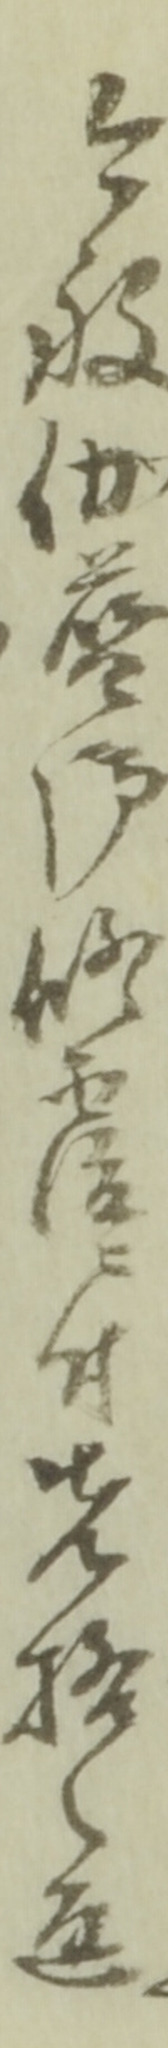今般伽藍御修覆二付先格之通
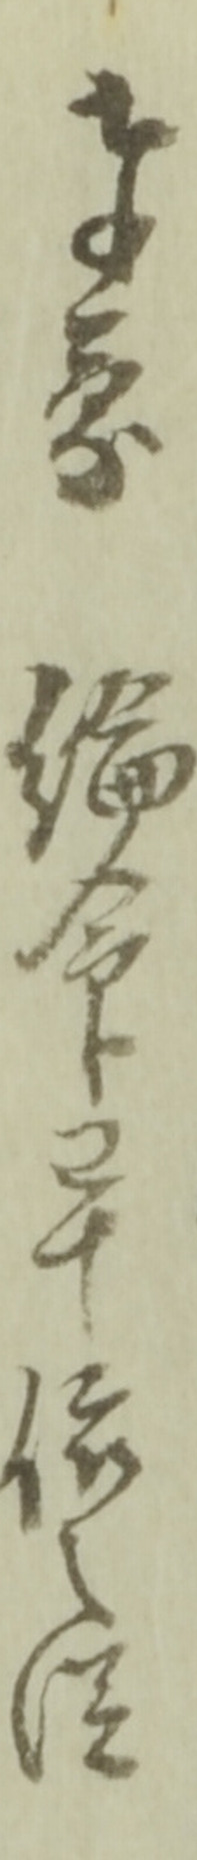奉蒙綸命畢依之従
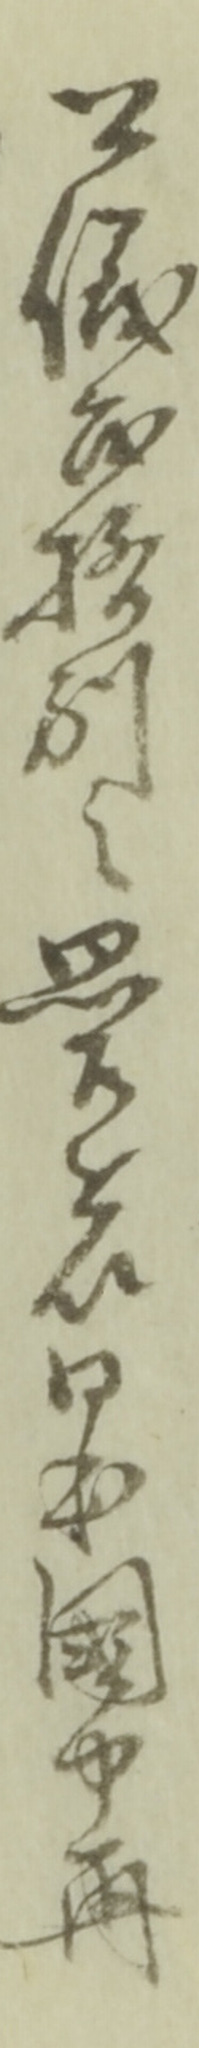公儀茂格別之思召を以日本を以被
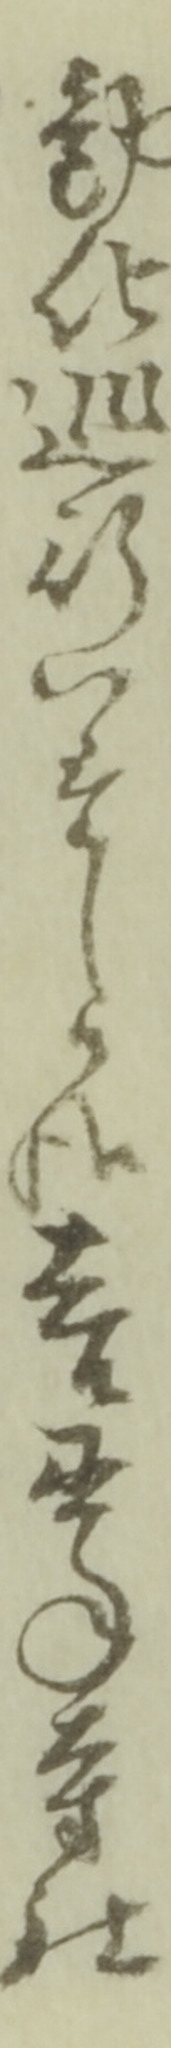勧化巡行いたし候様去卯丑年寺社
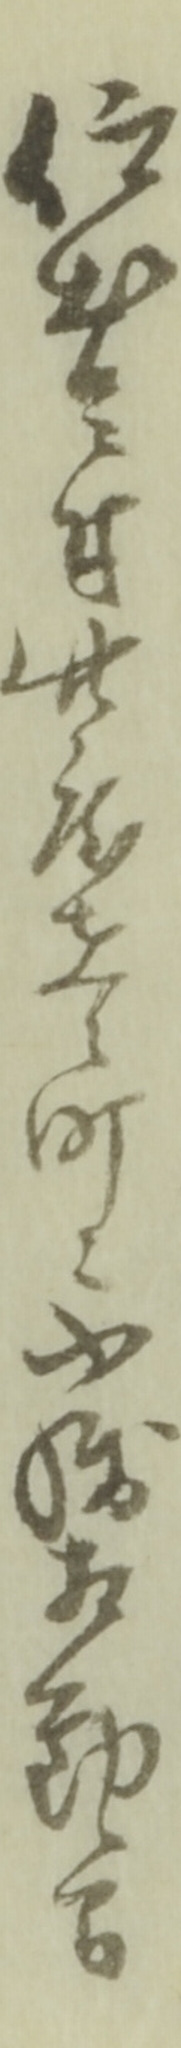仰出候二付此度在々町々不残相勧候間
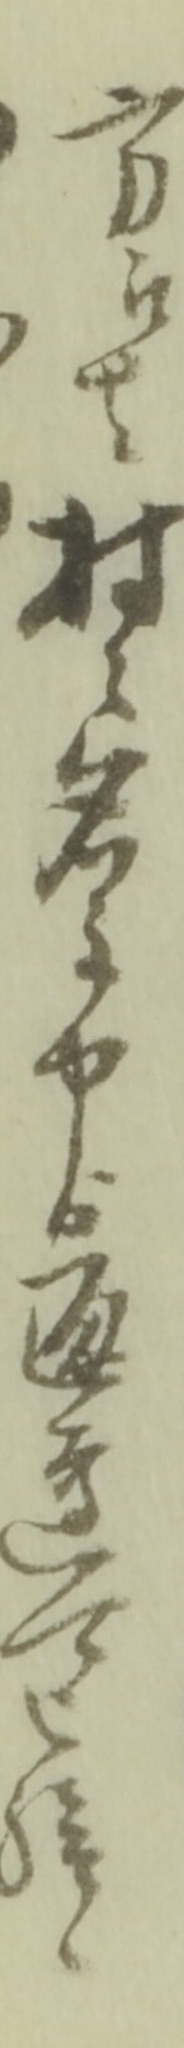方江者村々名主中より通達可被請候
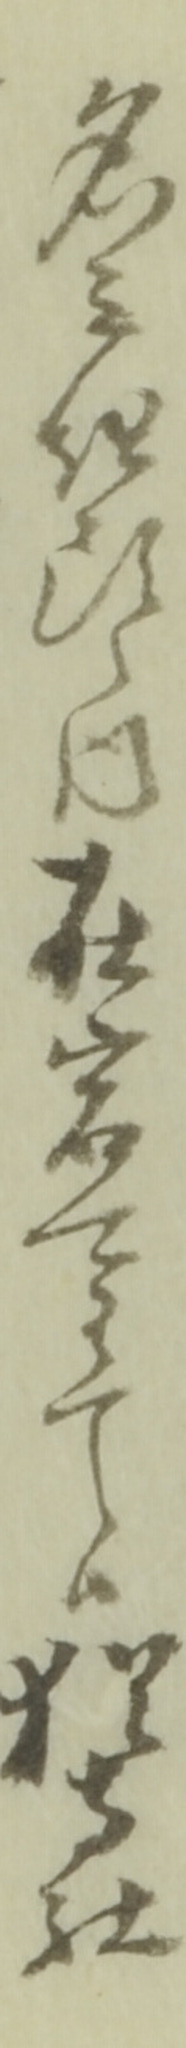名主組頭之内在宿可有候猶寺社
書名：御公儀様御領主様御触書控
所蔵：伊那市立高遠町図書館・合同会社AMANE
